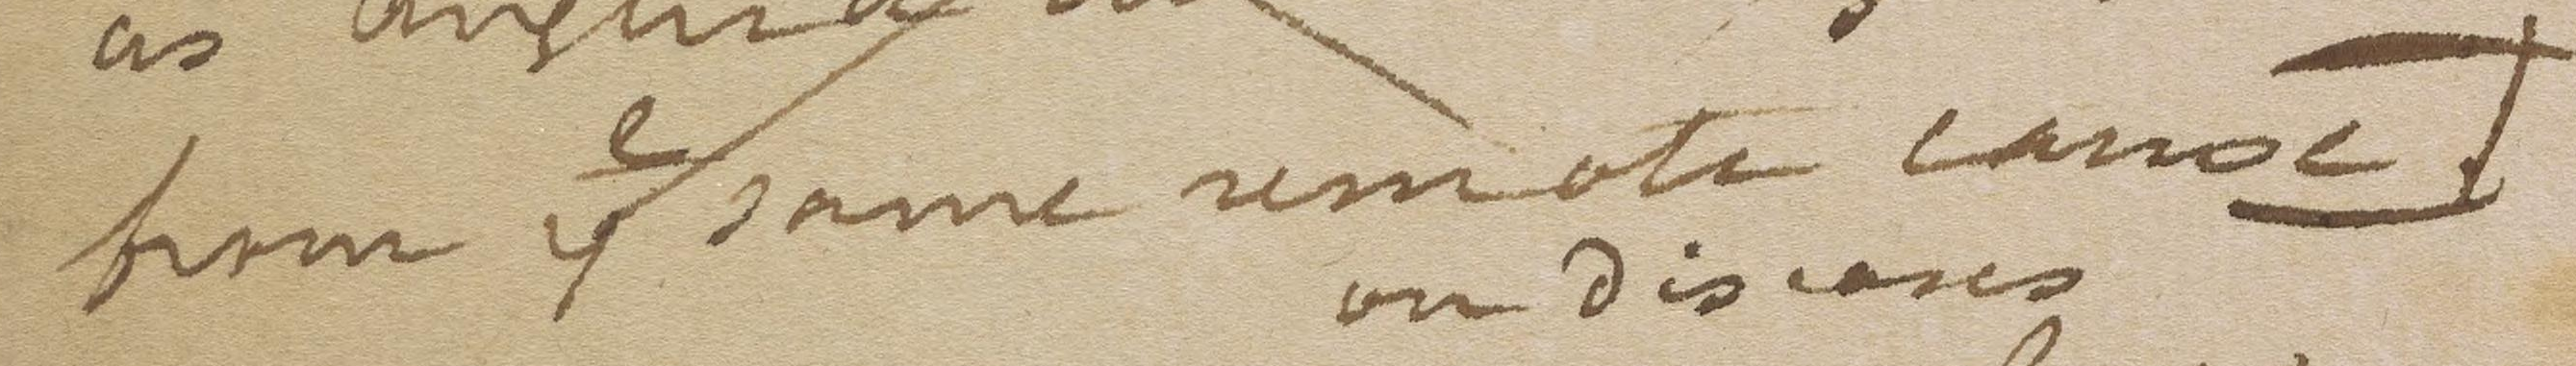from y^e same remote cause.)
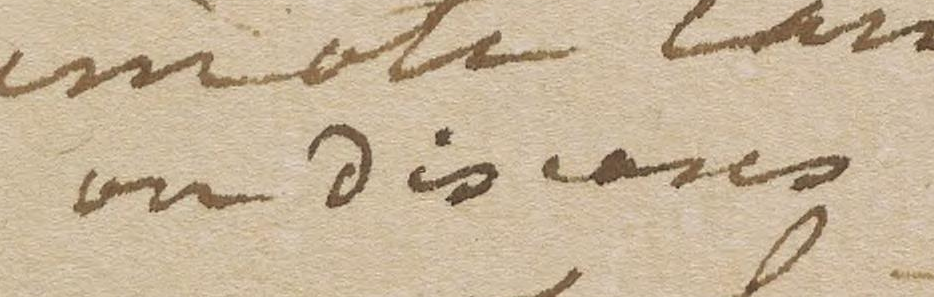on diseases
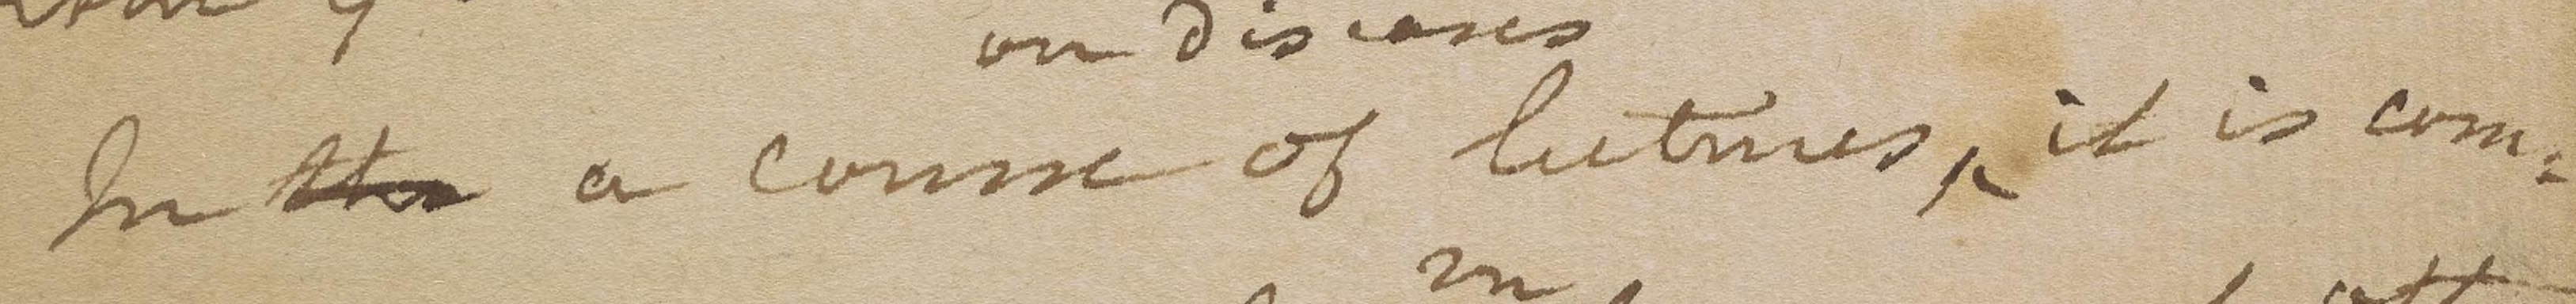In [the] a course of lectures, it is com-
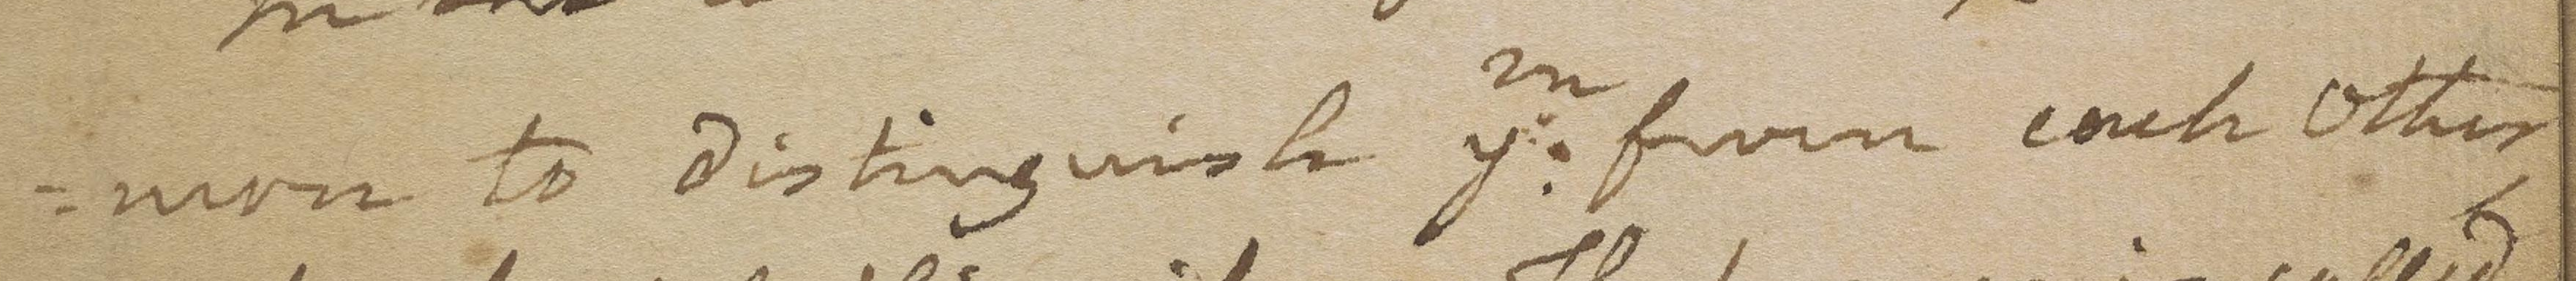mon to distinguish y^n from each other
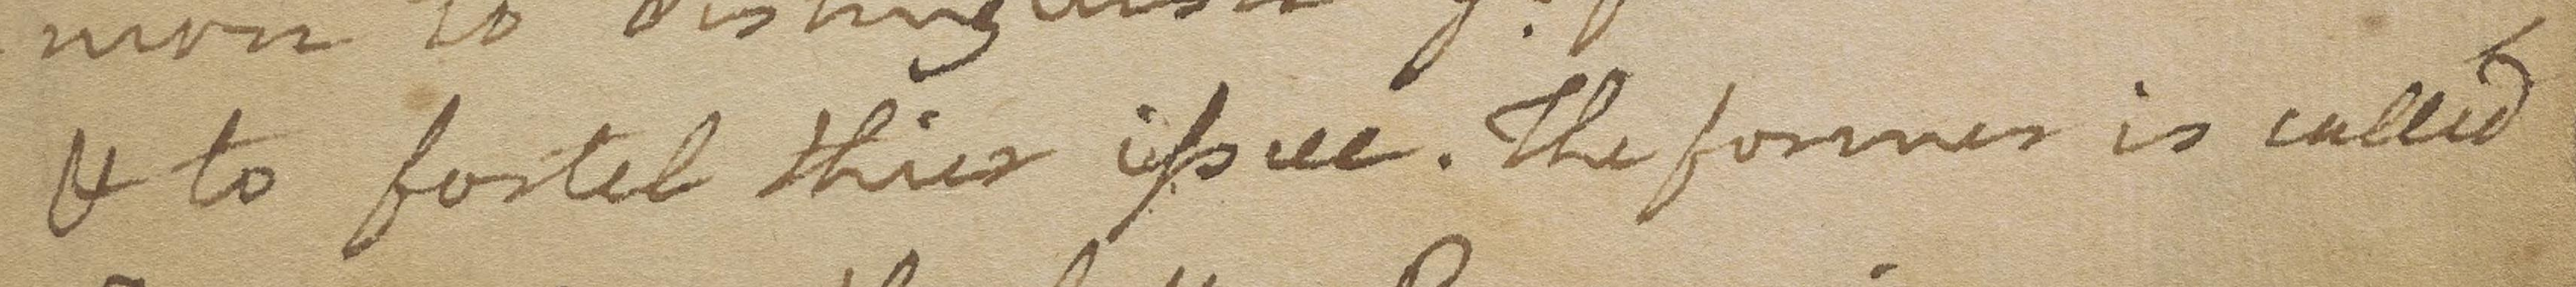& to fortel this issue. The former is called
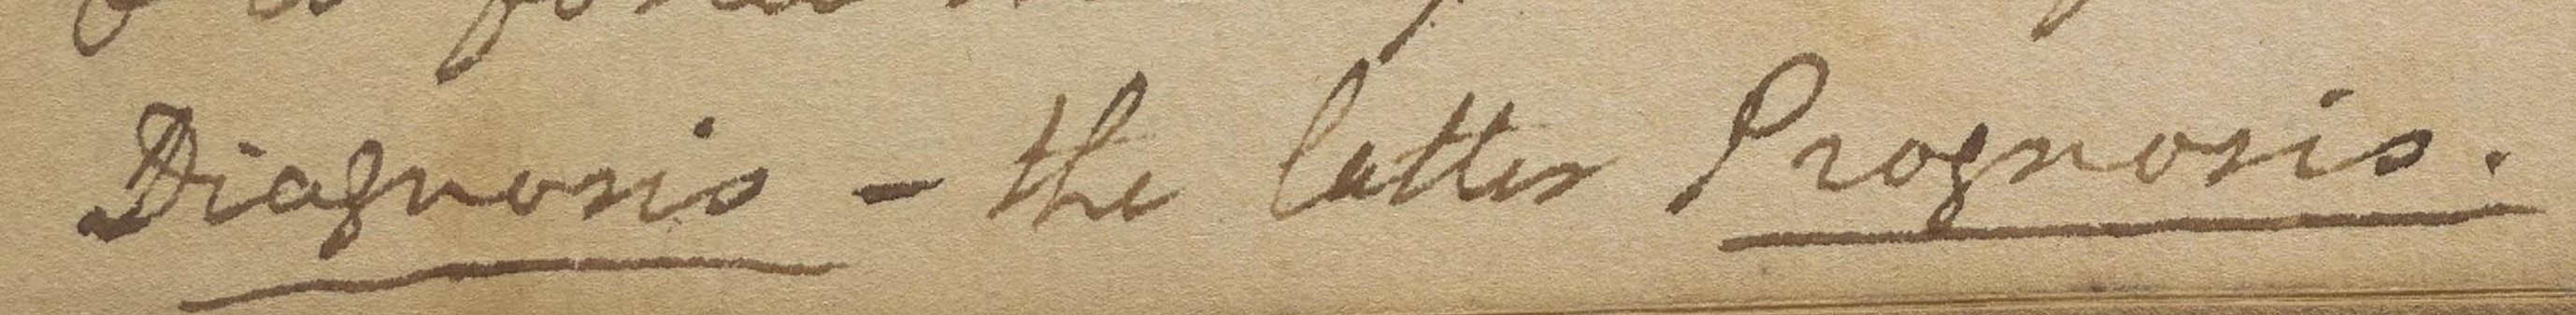Diagnosis - the latter Prognosis.
